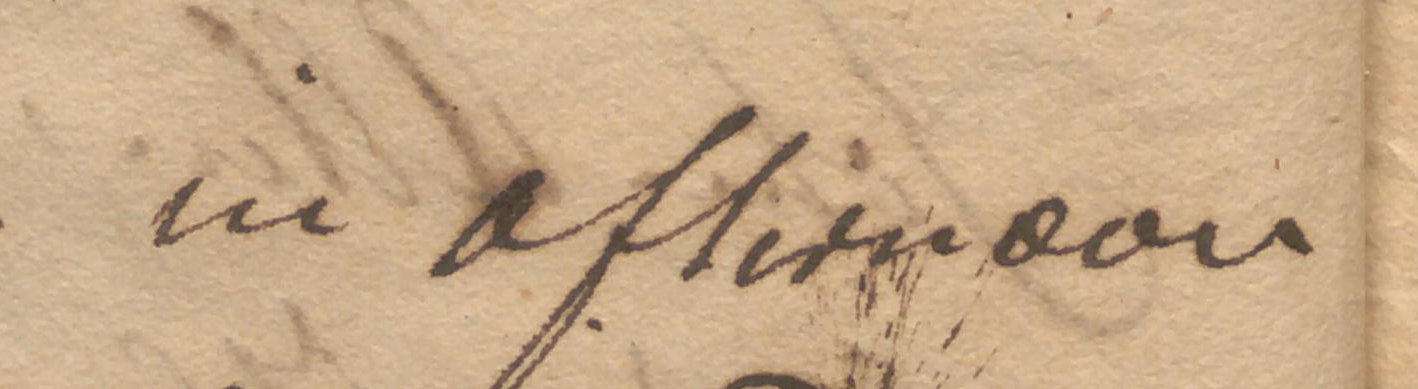in afternoon
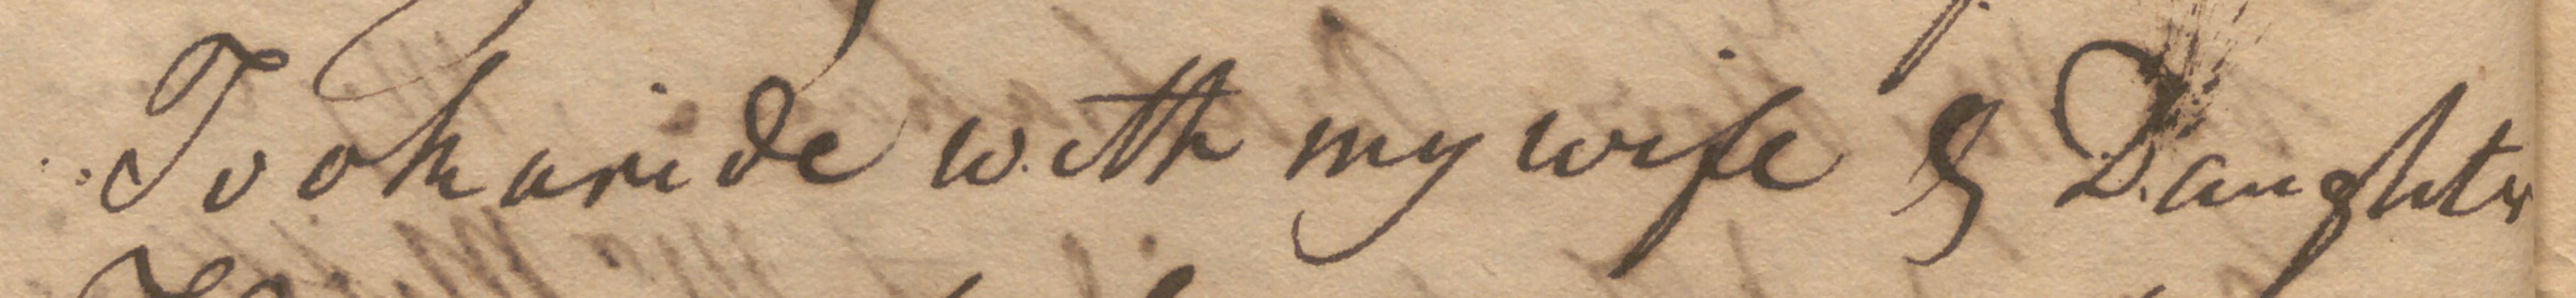Took a ride with my wife & Daughter
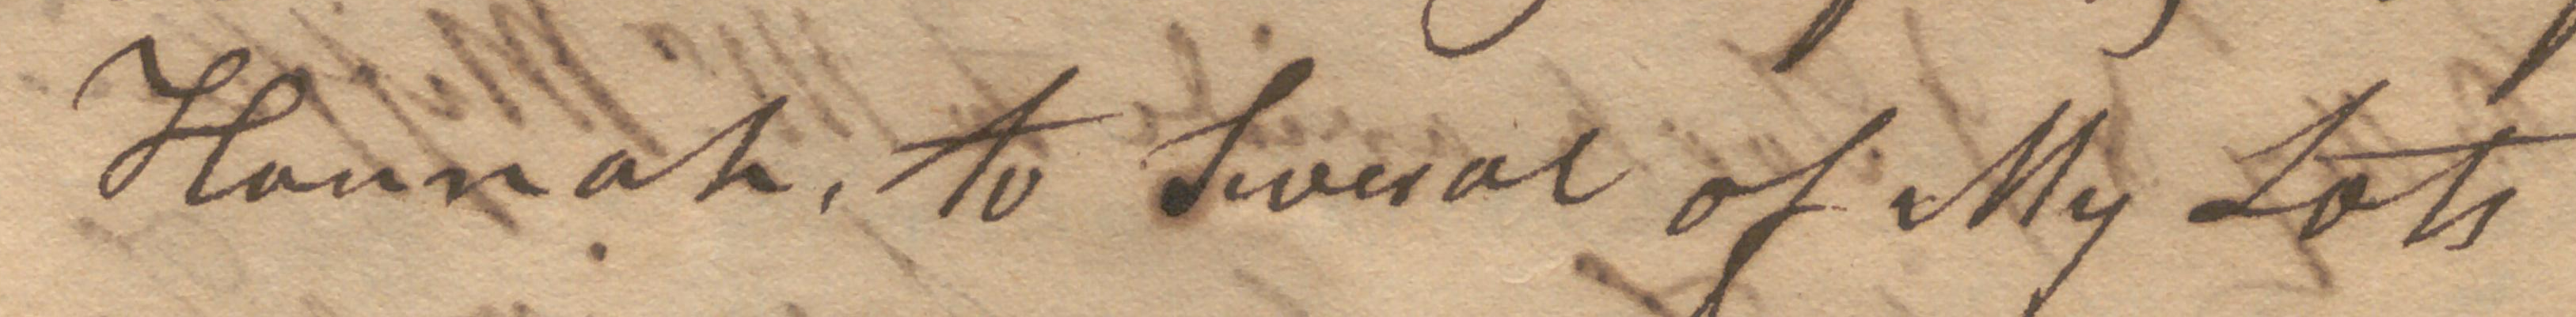Hannah, to Several of My Lots
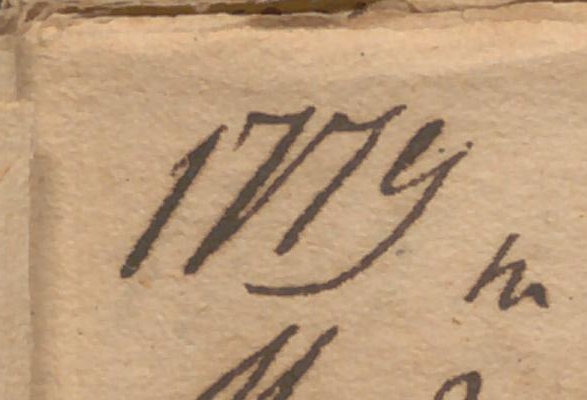1779
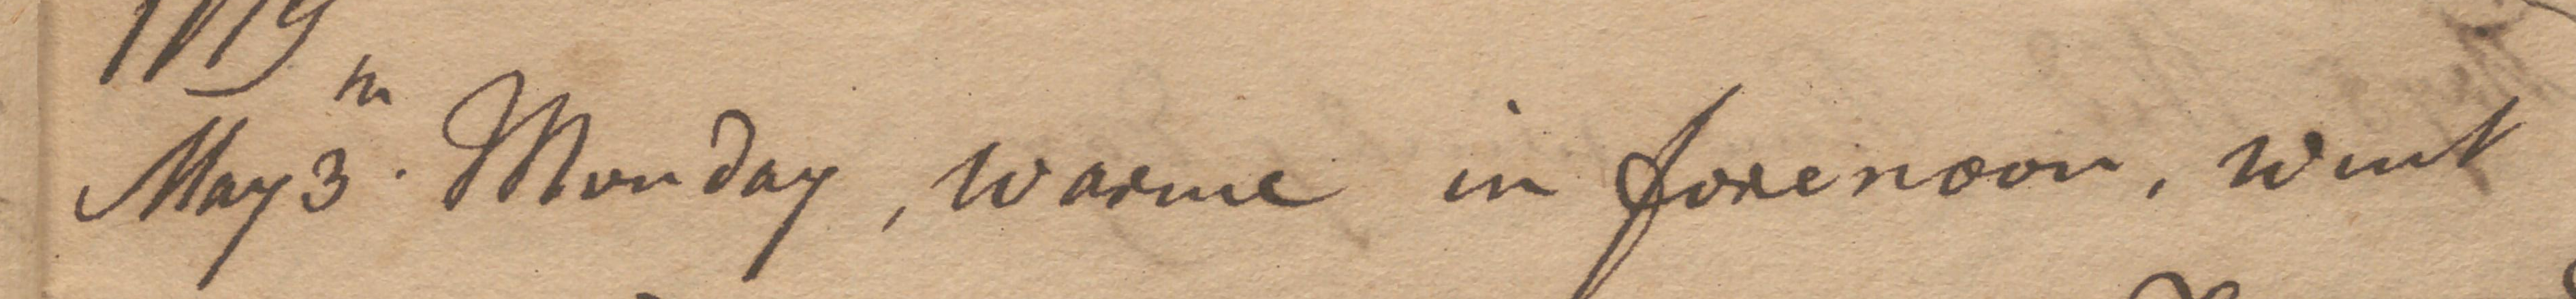May 3^th. Monday, warme in forenoon, went
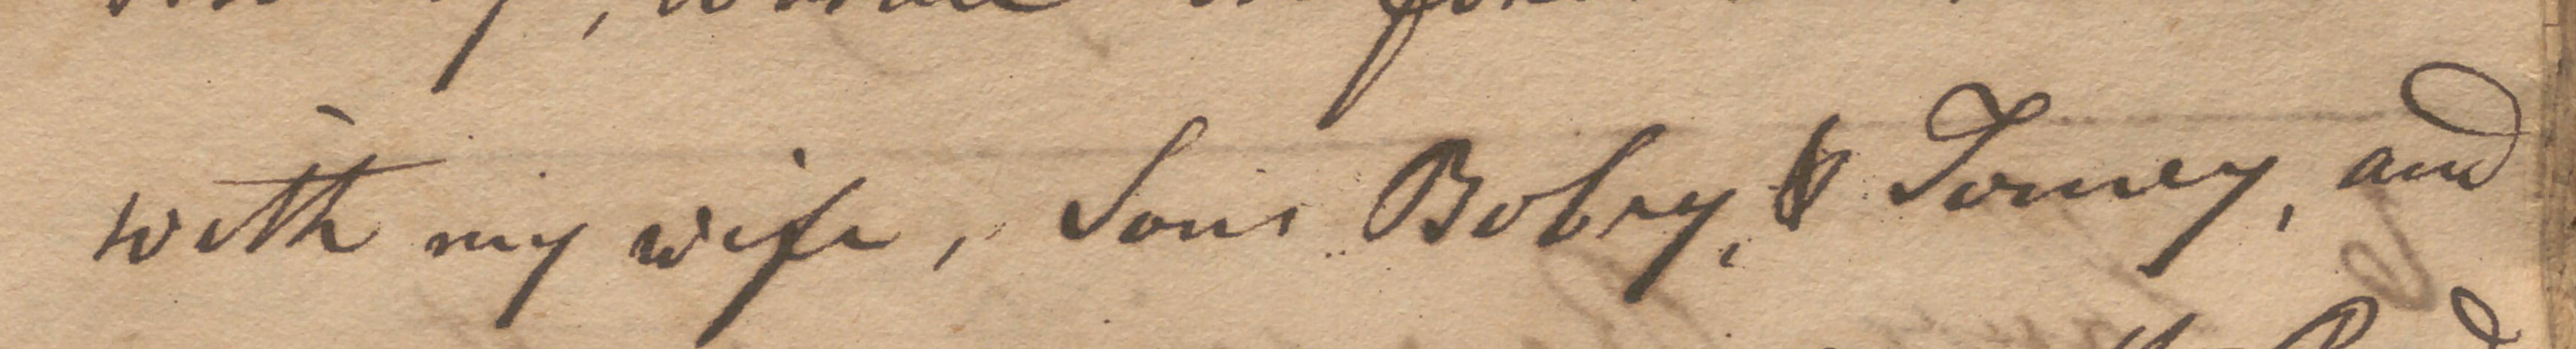with my wife, Sons Bobey & Tomey, and
